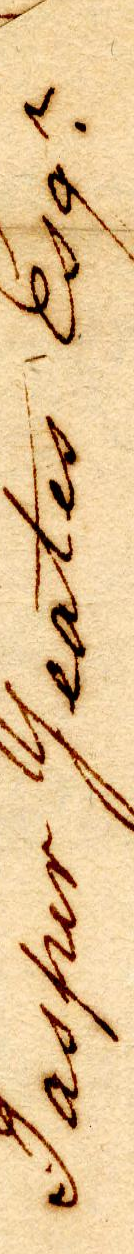Jasper Yeates Esq^e.
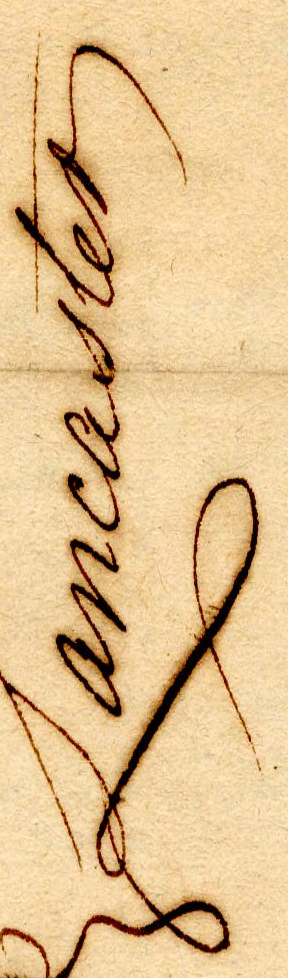Lancaster
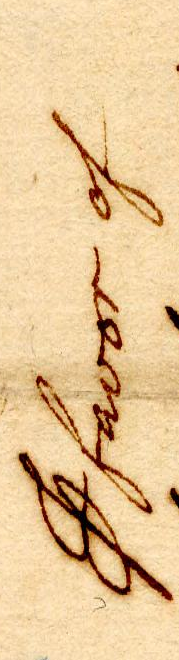per favor of
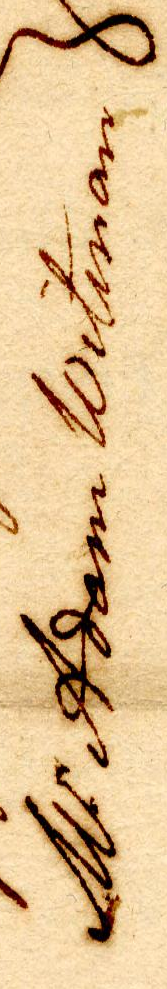M^r Adam Witeman
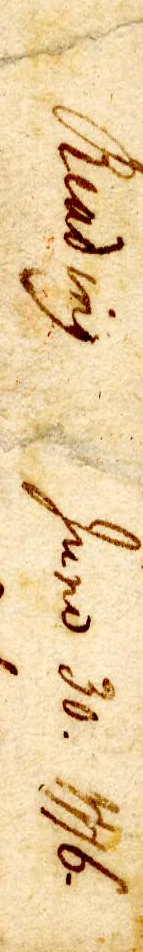Reading June 30. 1776.
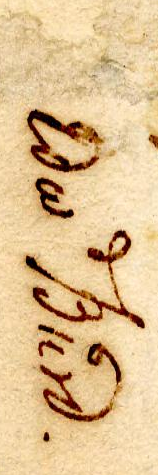Edw^D Bird
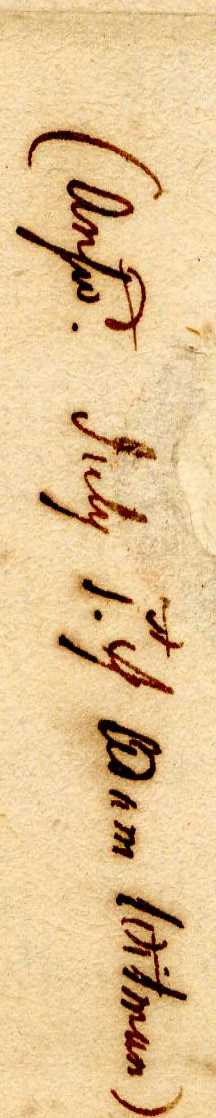(Answ^d. July 1^st Adam Witman)
